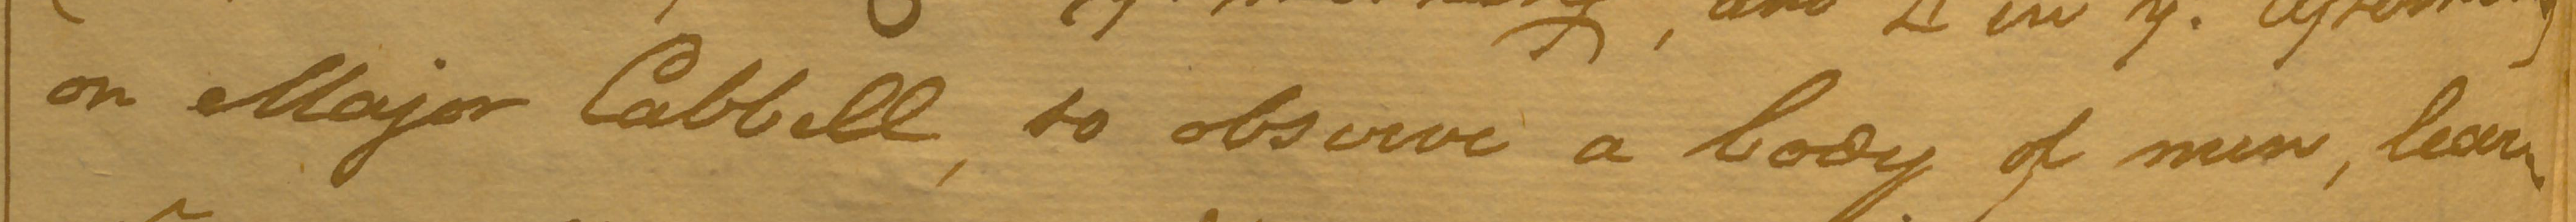on Major Cabbell to observe a body of men, learn
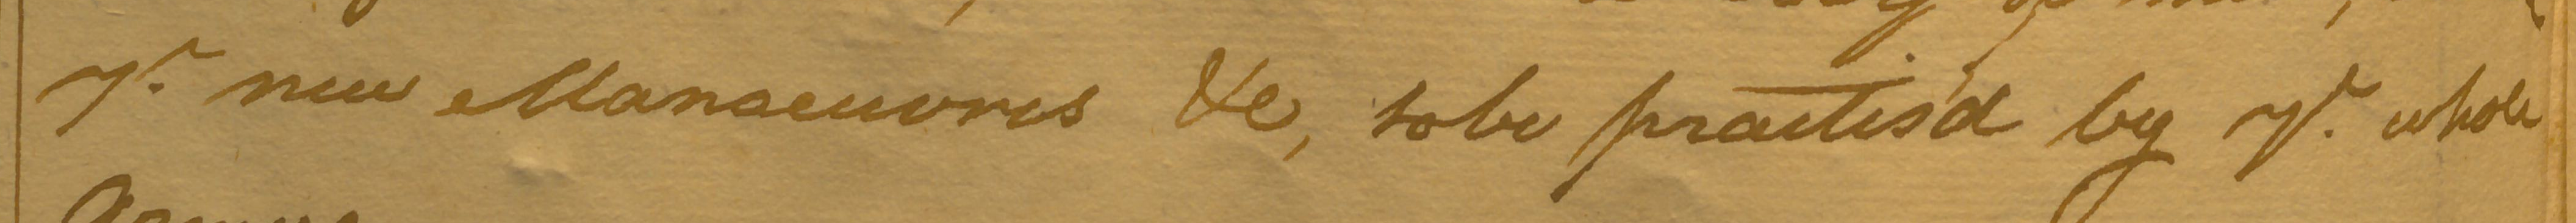y^e. new Manoeuvres &c, to be practis'd by y^e. whole
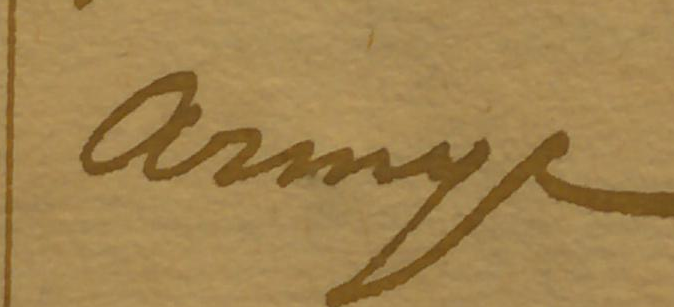army-
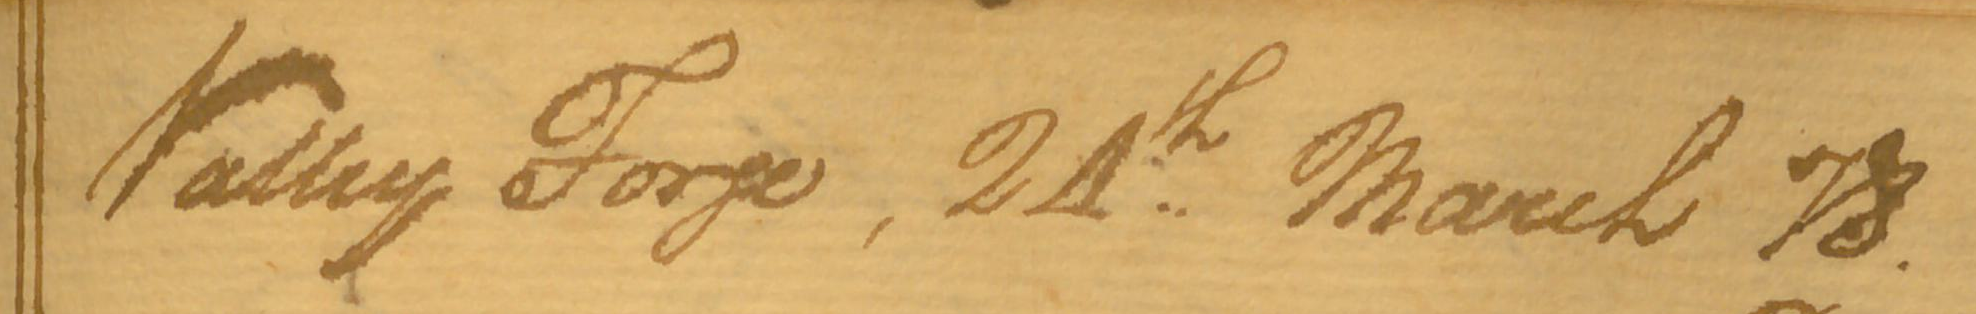Valley forge, 24^th. March 78.
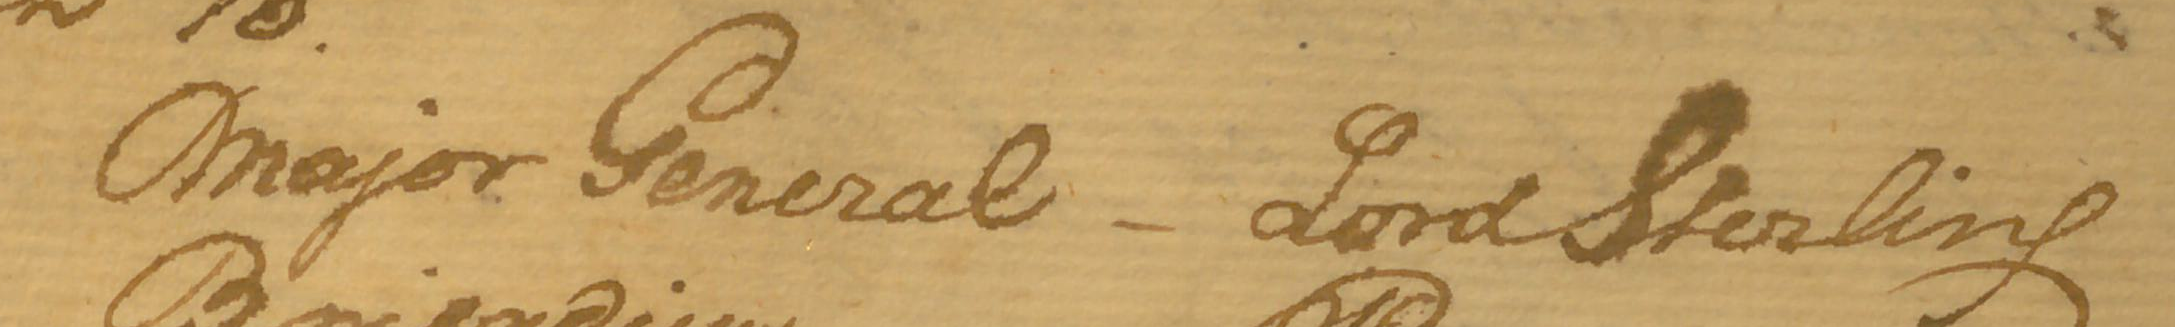Major General- Lord Sterling
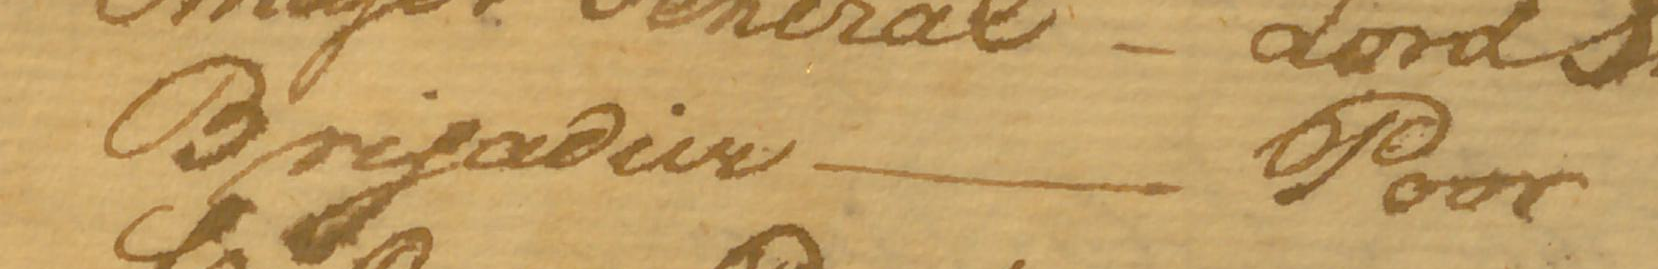Brigadier- Poor
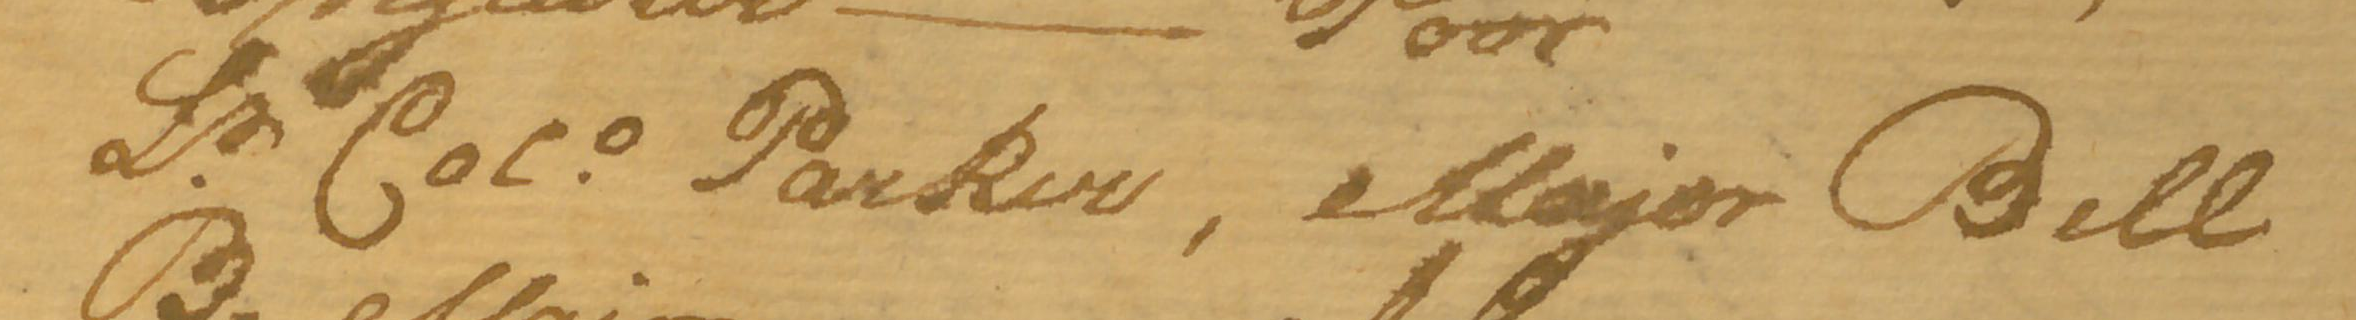L^t. Col^o. Parker, Major Bill
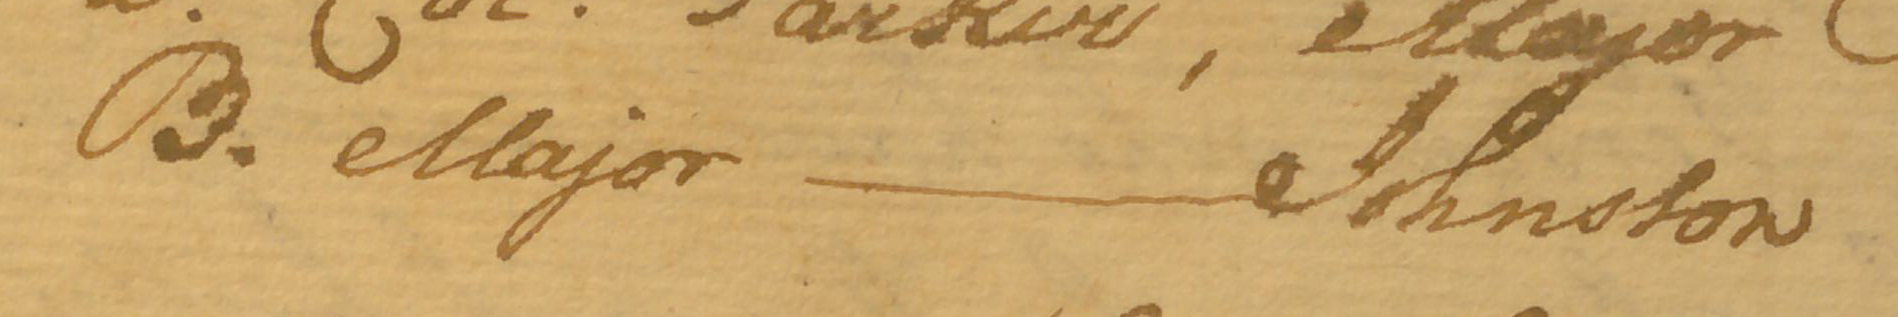B. Major- Johnston
